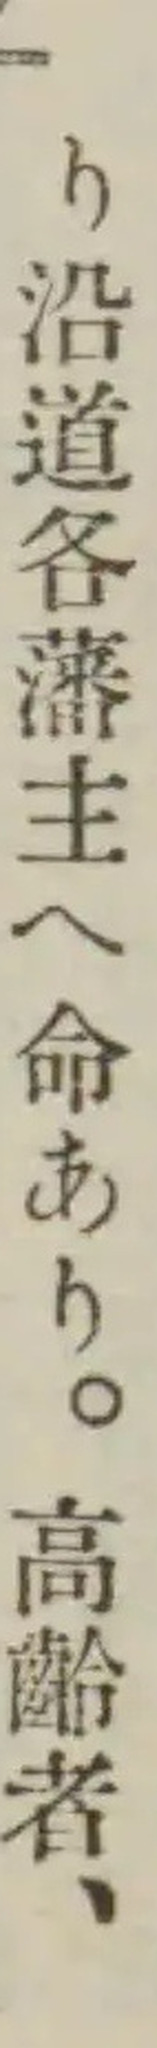り沿道各藩主へ命あり。高齢者、
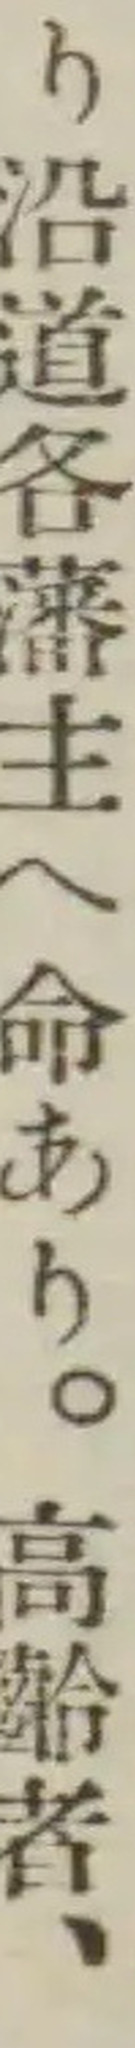り沿道各藩主へ命あり。高齢者、
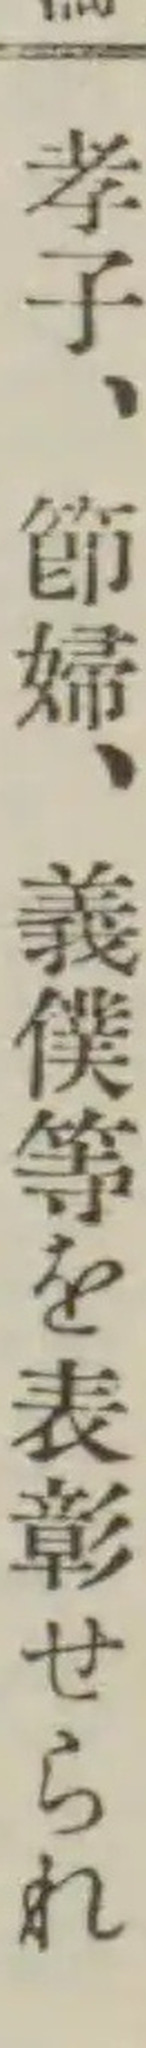孝子、節婦、義僕等を表彰せられ
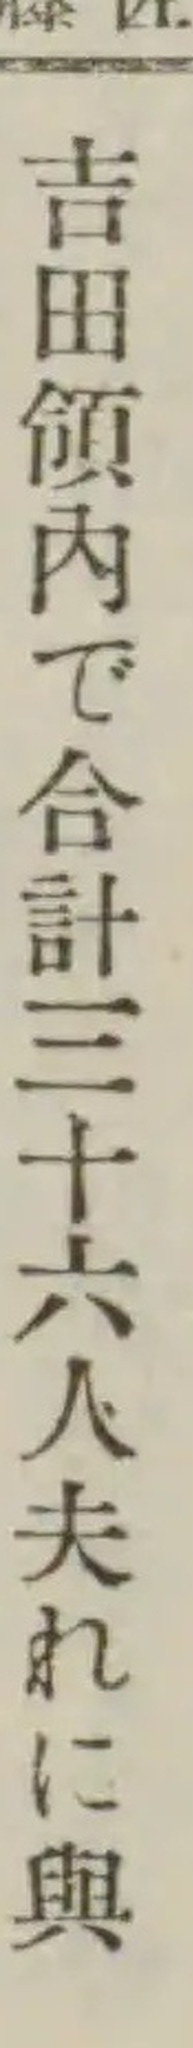吉田領内で合計三十六人夫れに与
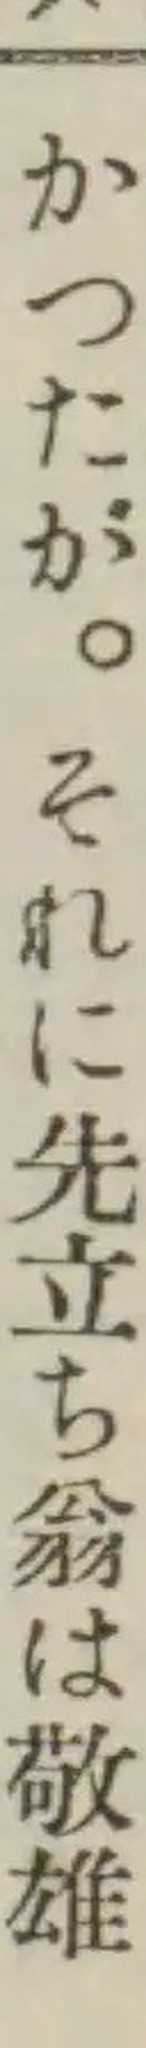かつたが。それに先立ち翁は敬雄
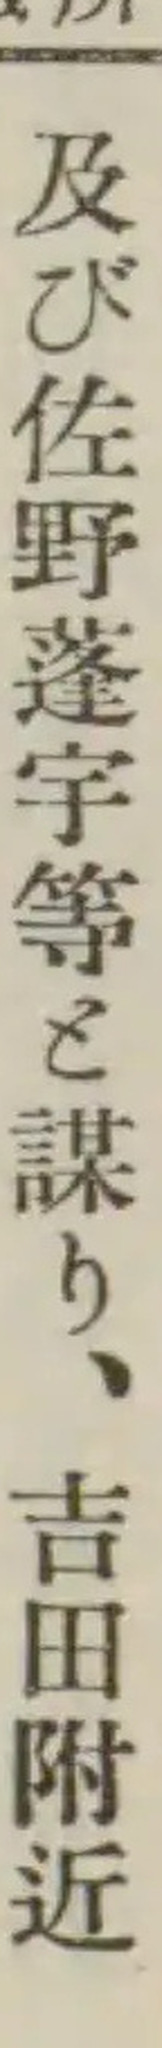及び佐野蓬宇等と謀り、吉田附近
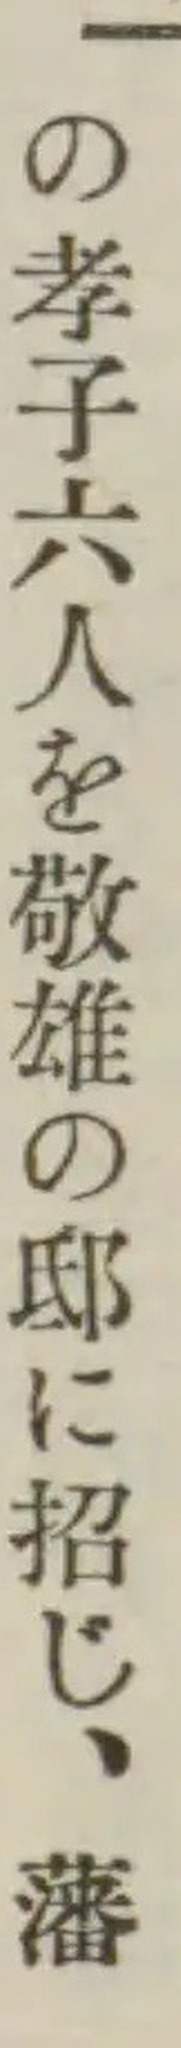の孝子六人を敬雄の邸に招じ、藩
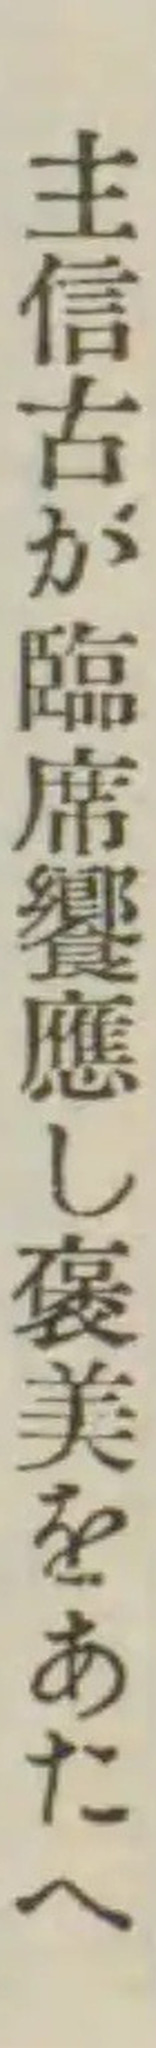主信古が臨席饗応し褒美をあたへ
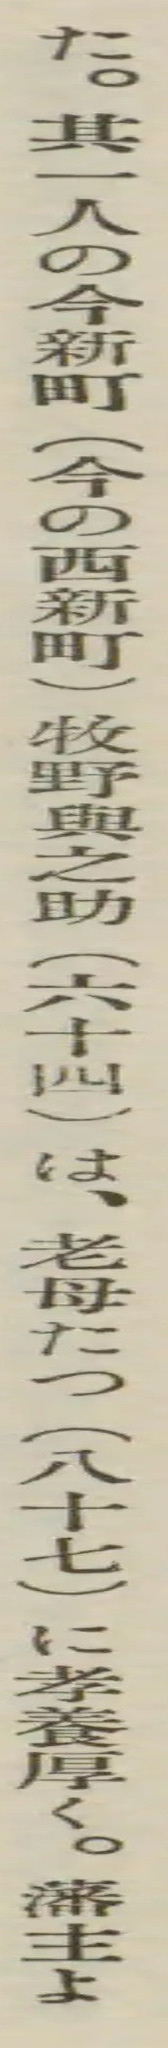た。其一人の今新町(今の西新町)牧野與之助(六十四)は、老母たつ(八十七)に孝養厚く。藩主よ
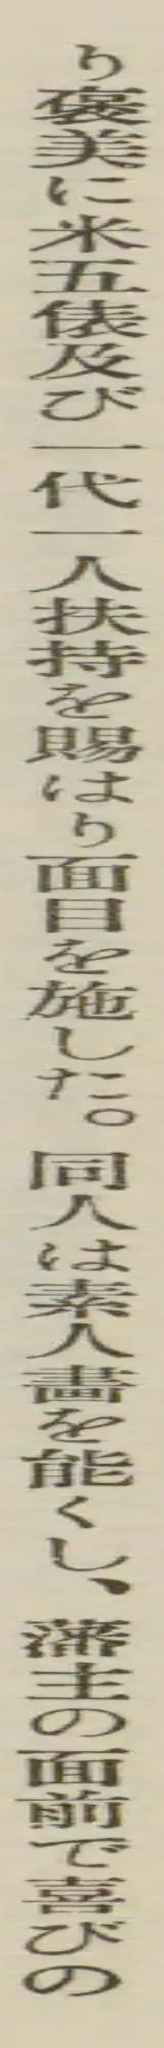り褒美に米五俵及び一代一人扶持を賜はり面目を施した。同人は素人画を能くし、藩主の面前で喜びの
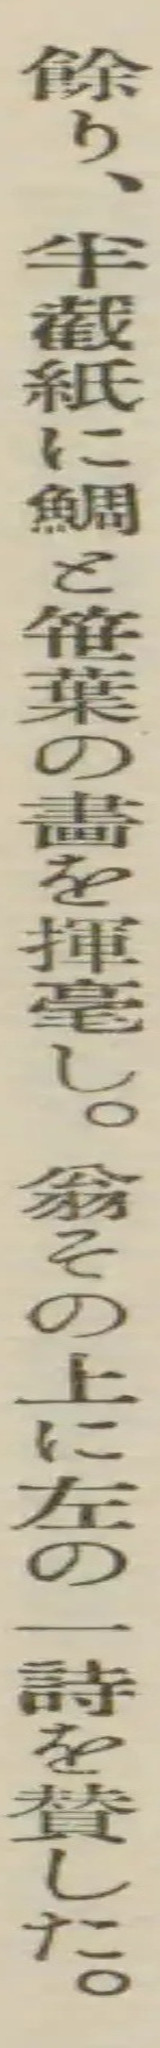余り、半截紙に鯛と笹葉の画を揮毫し。翁その上に左の一詩を賛した。

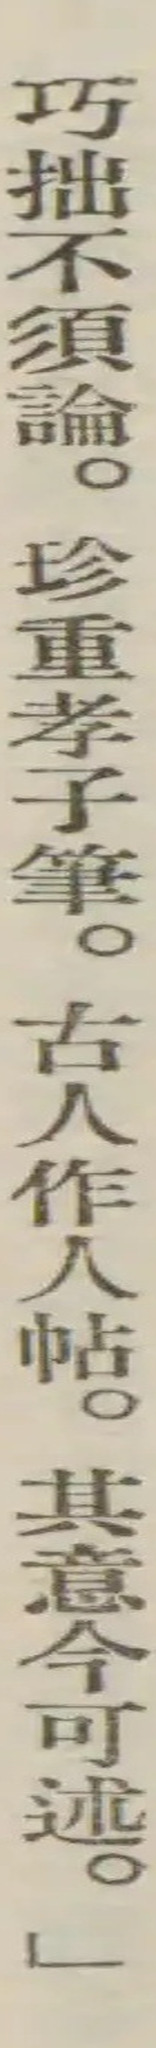巧拙不須論。珍重孝子筆。古人作人帖。其意今可述。」
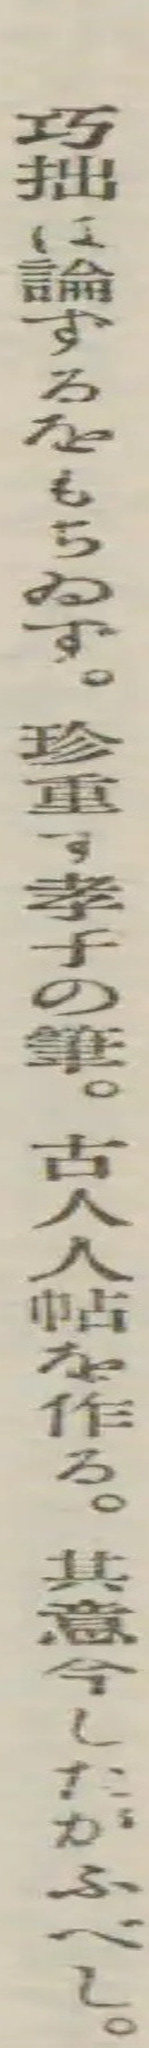巧拙は論ずるをもちゐず。珍重す孝子の筆。古人人帖を作る。其意今したがふべし。
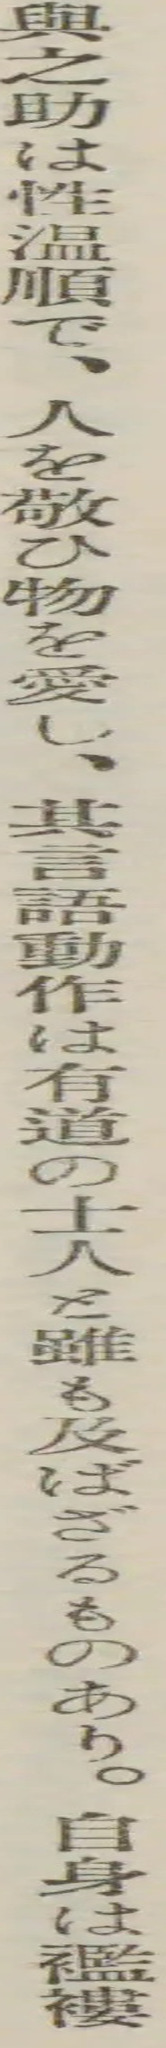與之助は性温順で、人を敬ひ物を愛し、其言語動作は有道の士人と雖も及ばざるものあり。自身は襤褸
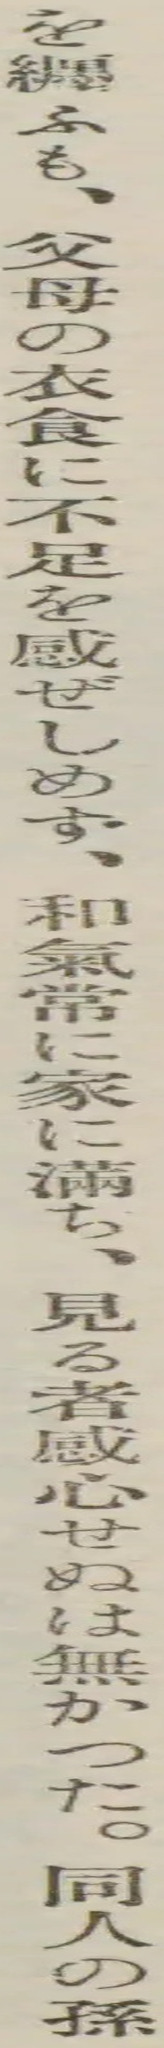を纒ふも、父母の衣食に不足を感ぜしめず。和気常に家に満ち、見る者感心せぬは無かつた。同人の孫
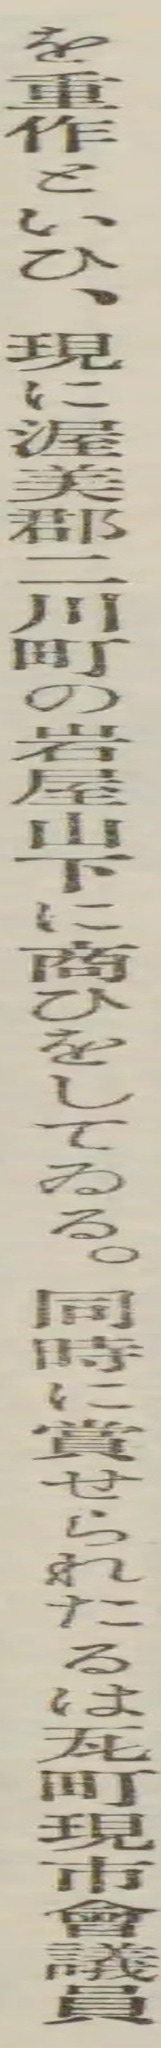を重作といひ、現に渥美郡二川町の岩屋山下に商ひをしてゐる。同時に賞せられたるは瓦町現市会議員
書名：小野湖山翁小伝
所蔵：国立国会図書館 National Diet Library, JAPAN
